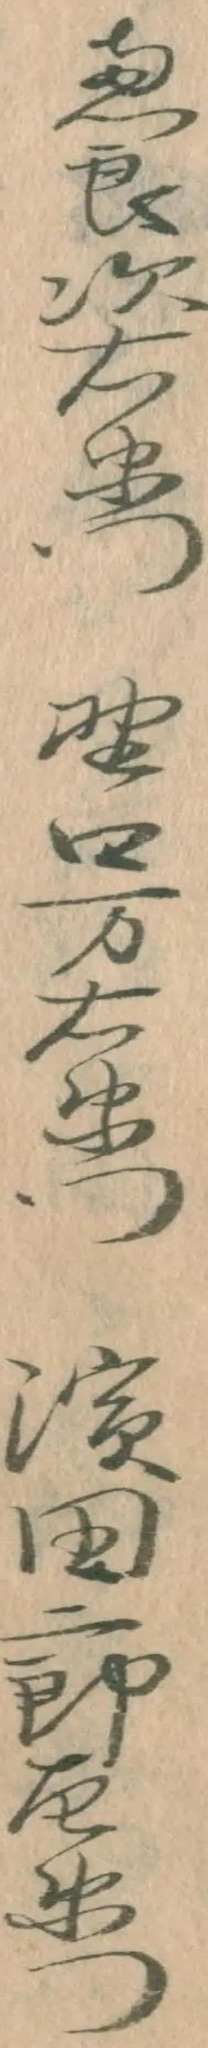恵良次右衛門野口万右衛門浜田二郎左衛門
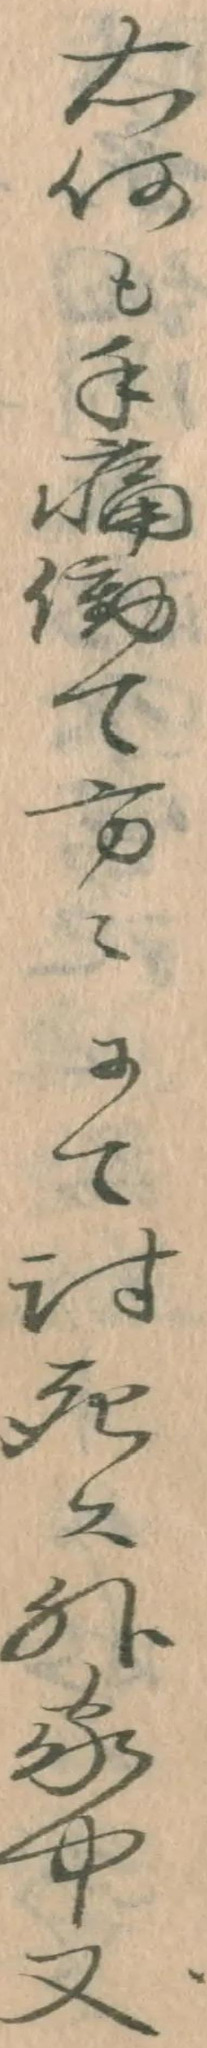右何も手痛働て方々尓て討死す外家中又
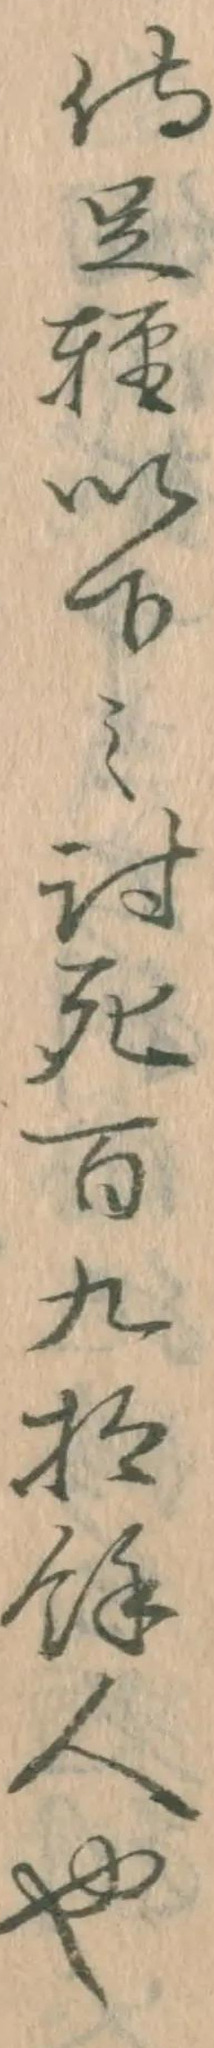侍足軽以下之討死百九拾四人也
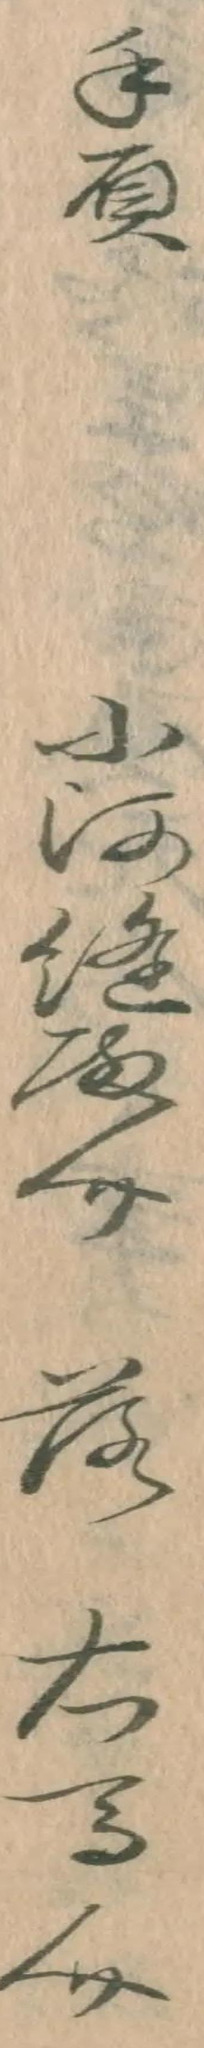手負小河縫殿助落右馬介
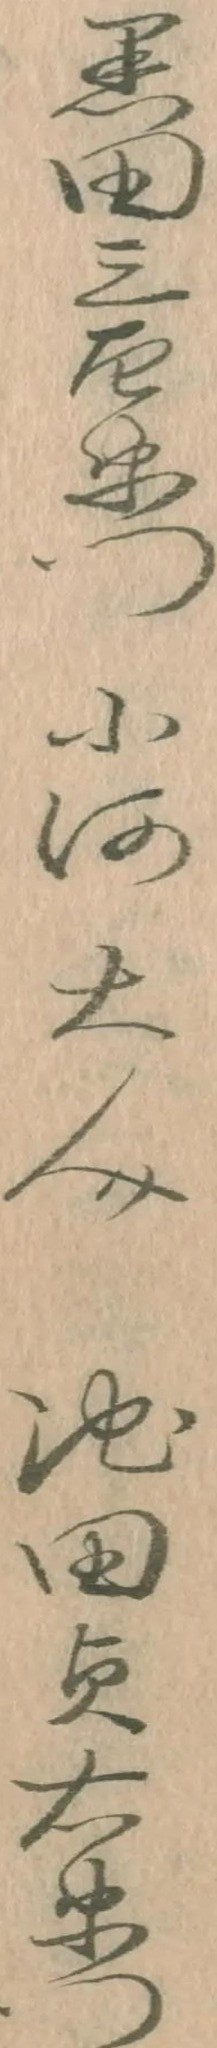黒田三左衛門小河大介池田貞右衛門
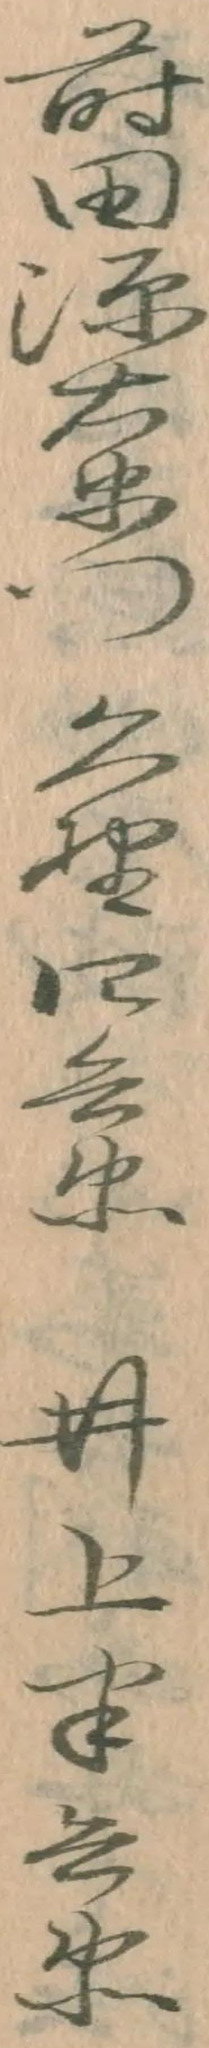蒔田源右衛門久野四兵衛井上半兵衛
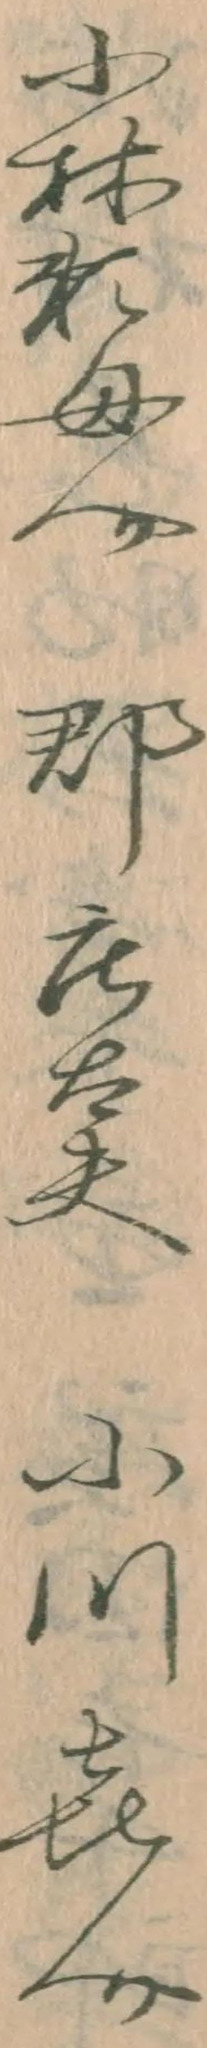小林頼母助郡庄太夫小川喜介
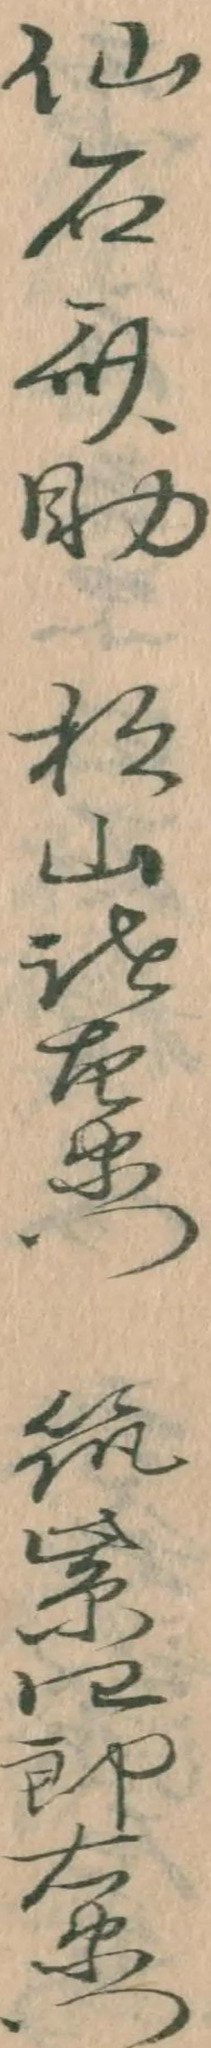仙石斎助杉山諸左衛門筑紫四郎右衛門
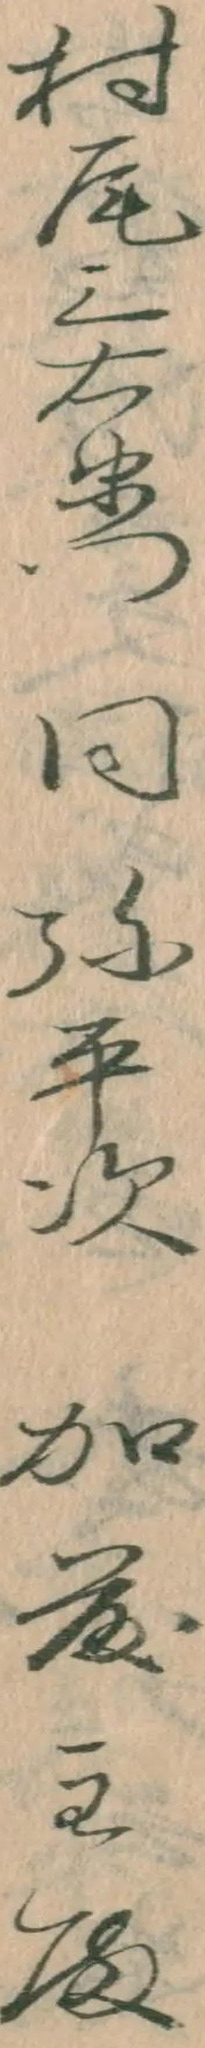村尾三右衛門同弥平次加藤主殿
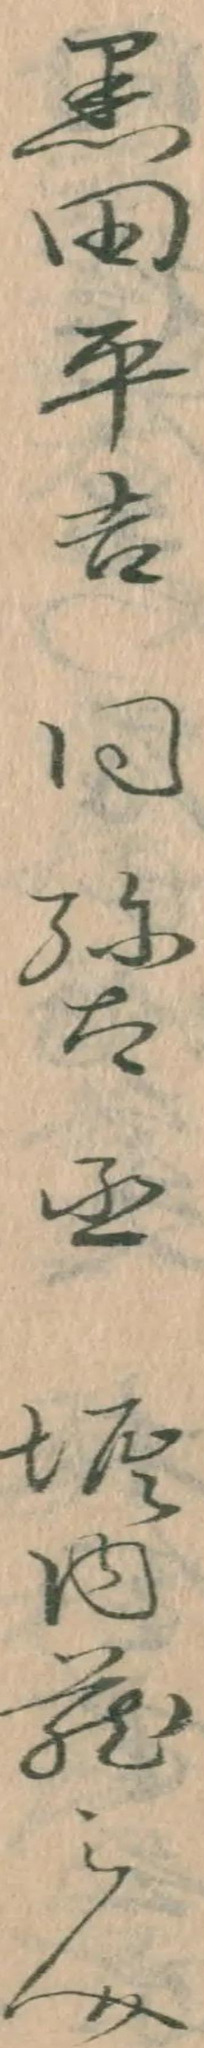黒田平吉同弥太丞堀田蔵之介
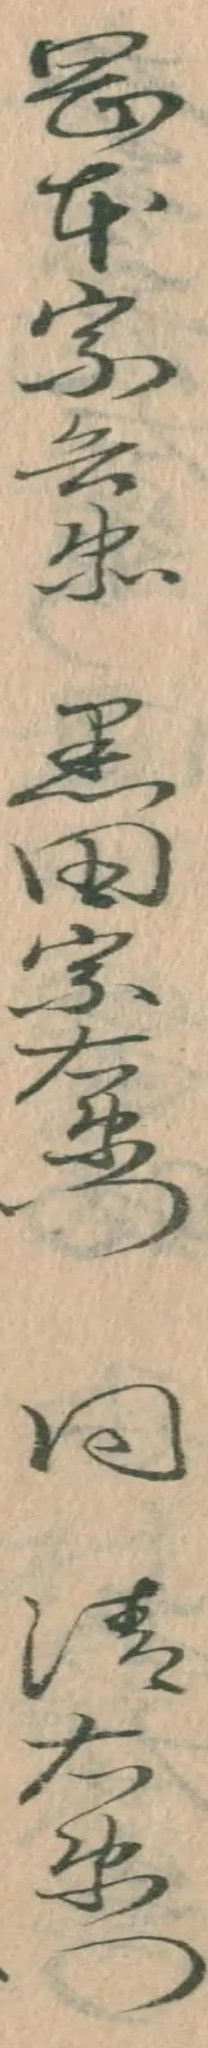岡本衆兵衛黒田宗右衛門同清右衛門
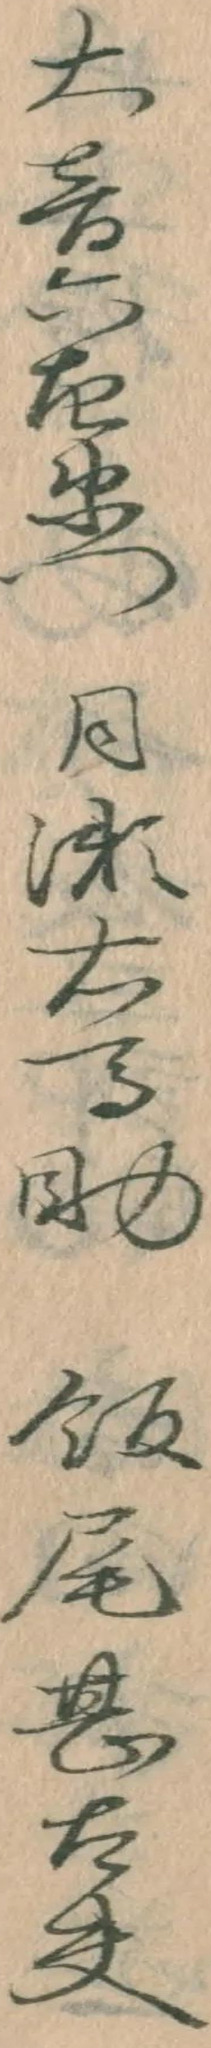大音六左衛門月瀬右馬助飯尾甚太夫
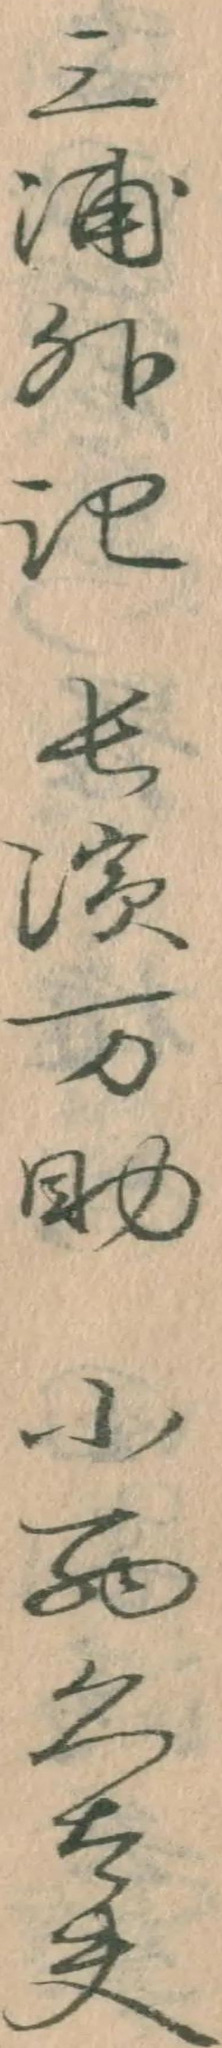三浦外記長浜万助小西久太夫
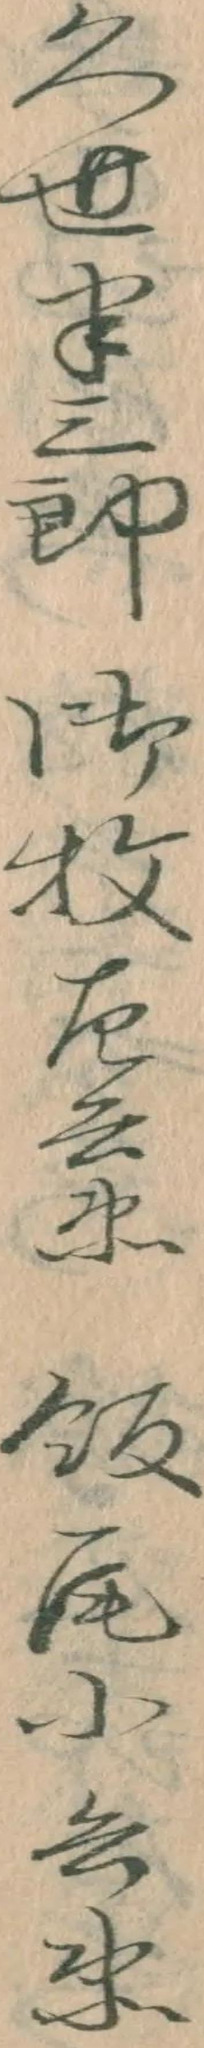久世半三郎御牧左兵衛飯尾小兵衛
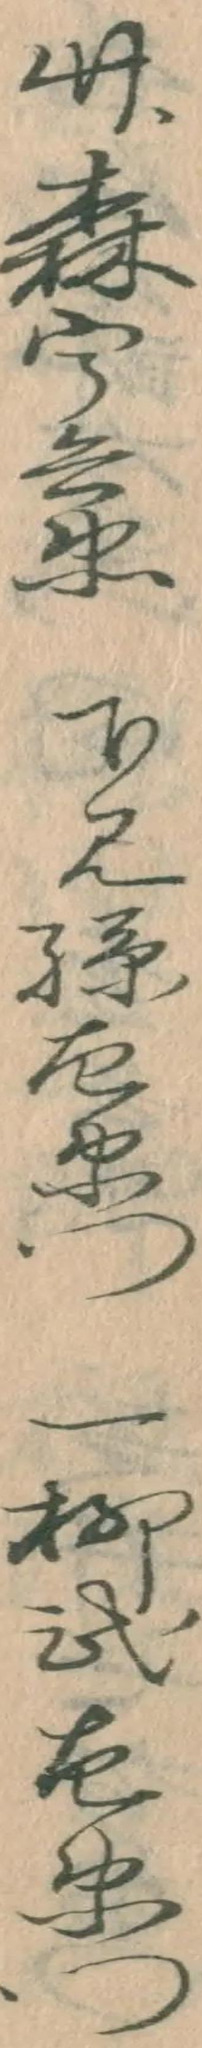竹森宇兵衛下見孫左衛門一柳武左衛門
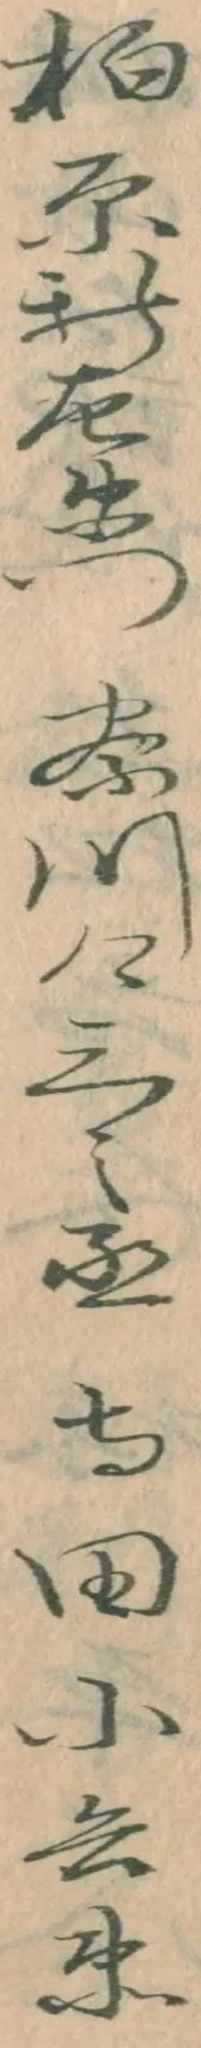柏原新左衛門奈川郷三之丞寺田小兵衛
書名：切支丹御退治記 49巻. [9]
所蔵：国立国会図書館 National Diet Library, JAPAN
